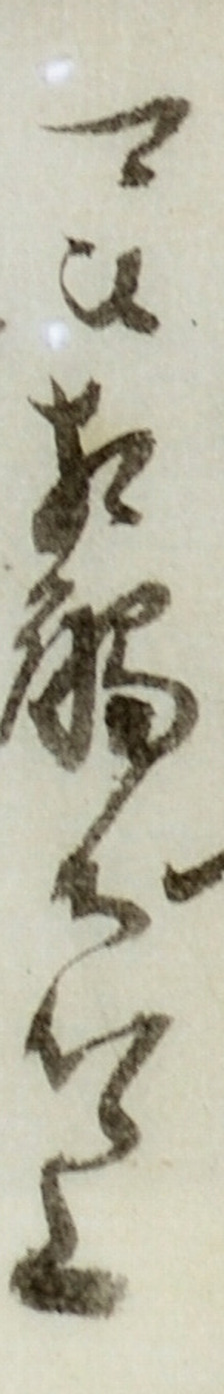可被相触候以上
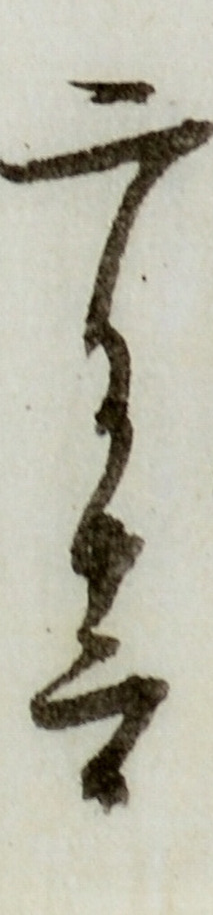二月十二日
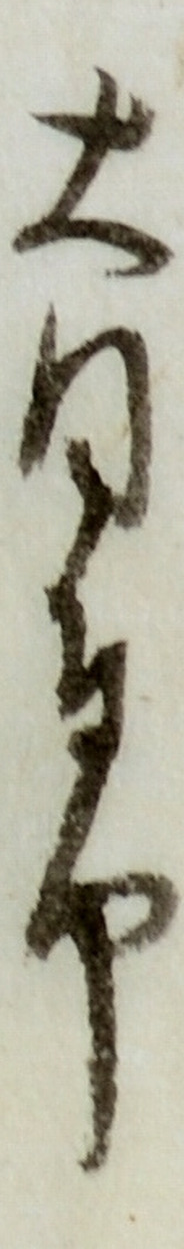大目付中

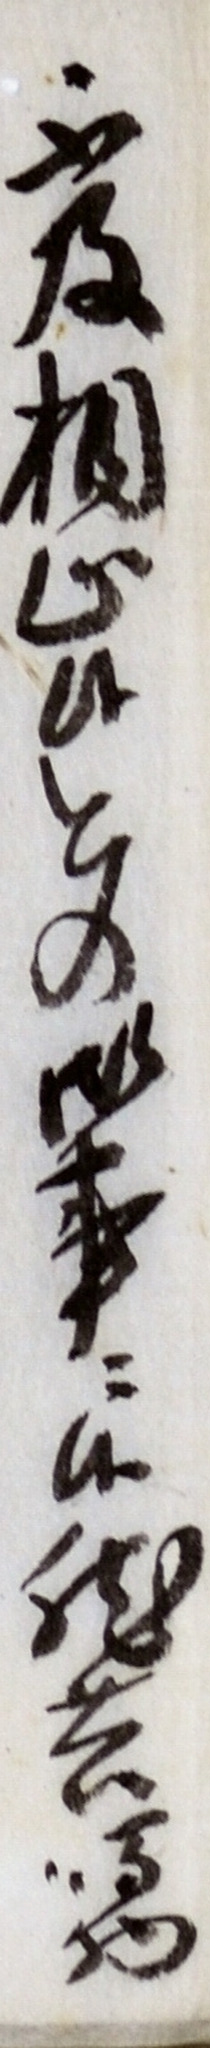不及相止候との御事に候然共鳴物
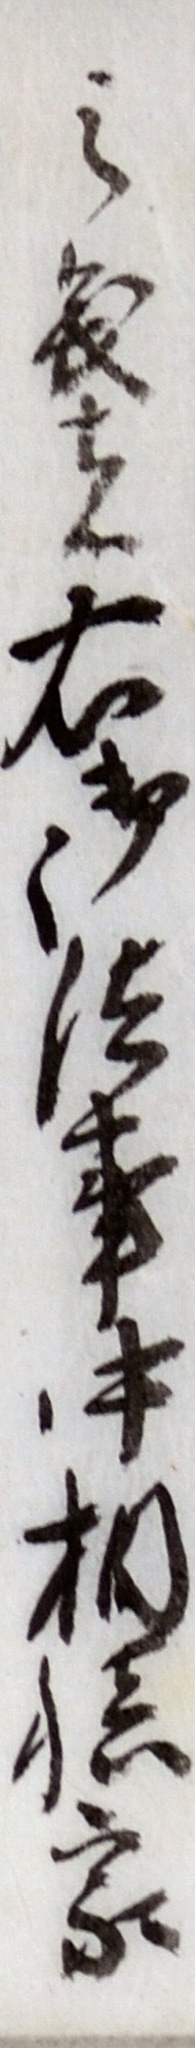之義は右御法事中相慎家
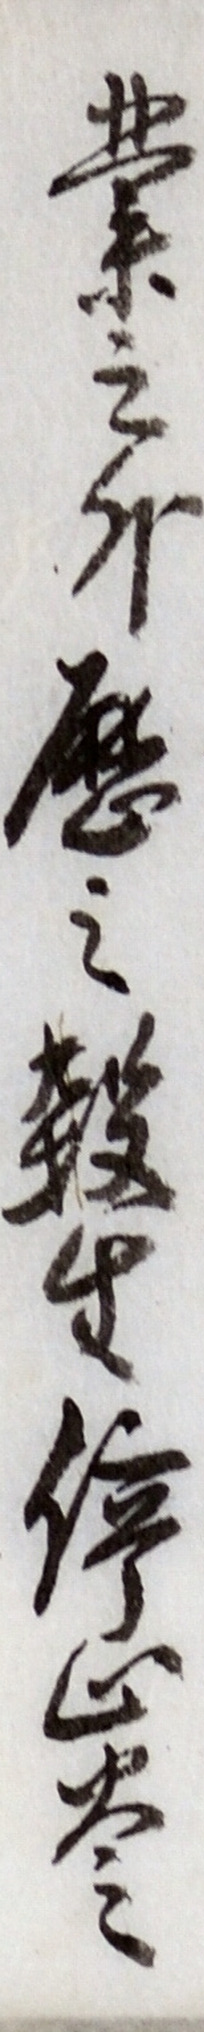業之外歴之殺生停止火之
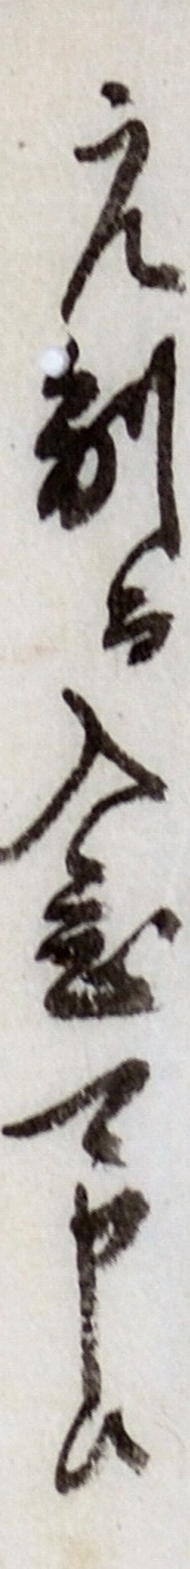元別而入念可申候
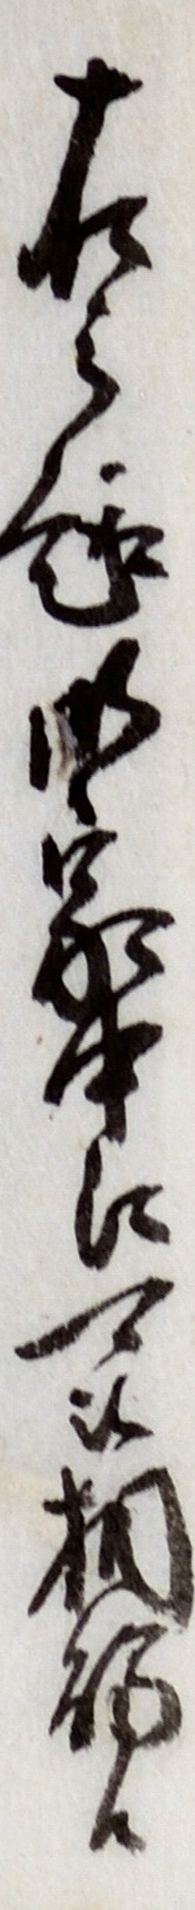右之趣御家中え可被相触候
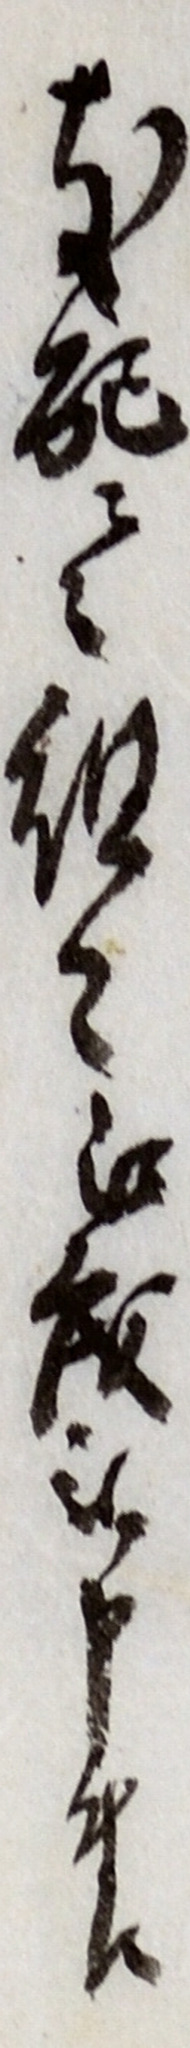支配々々組々えも被申付候
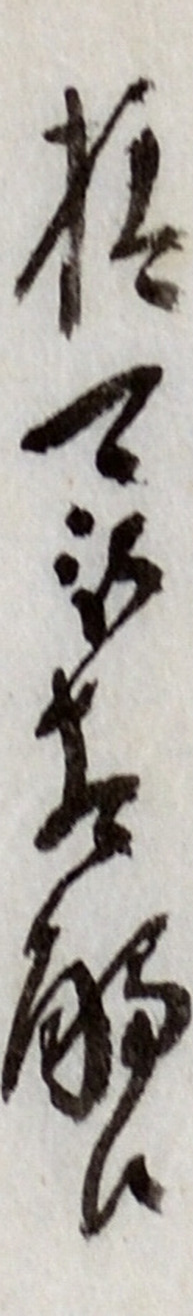様可被相触候
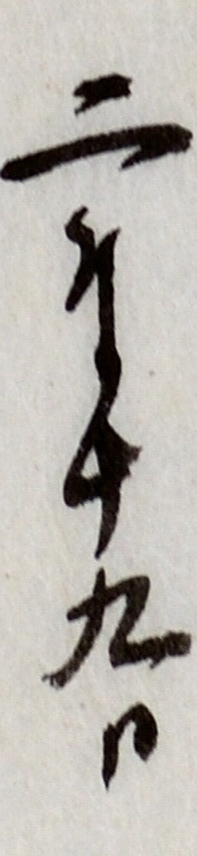二月十九日
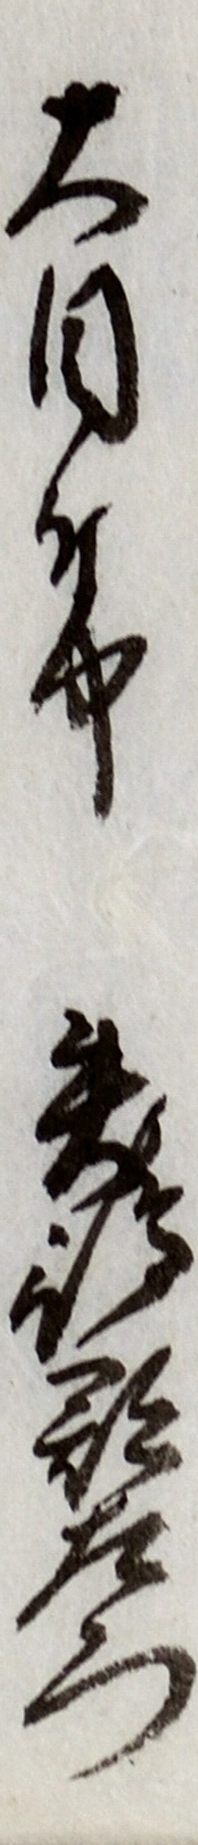大目付中矢島郡左衛門
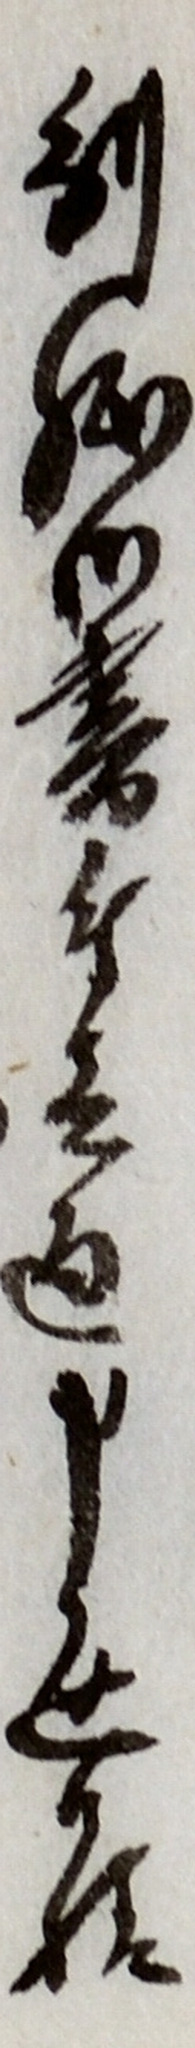別紙御書付壱通申達候様
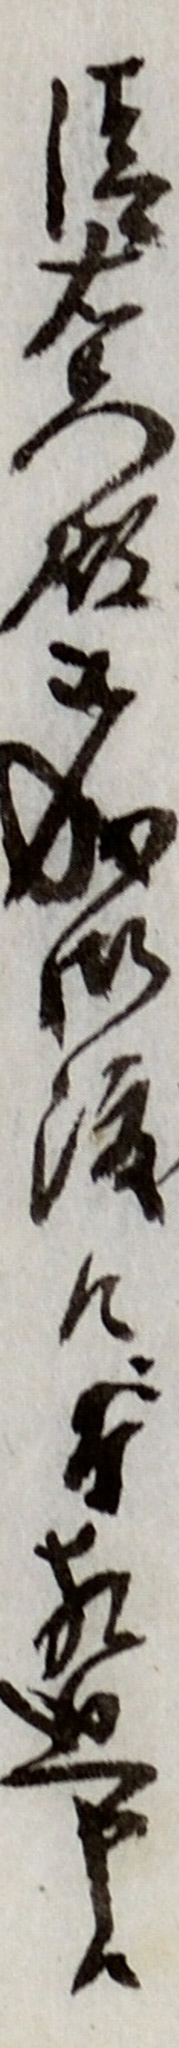清右衛門殿被成御渡候に付相廻申候
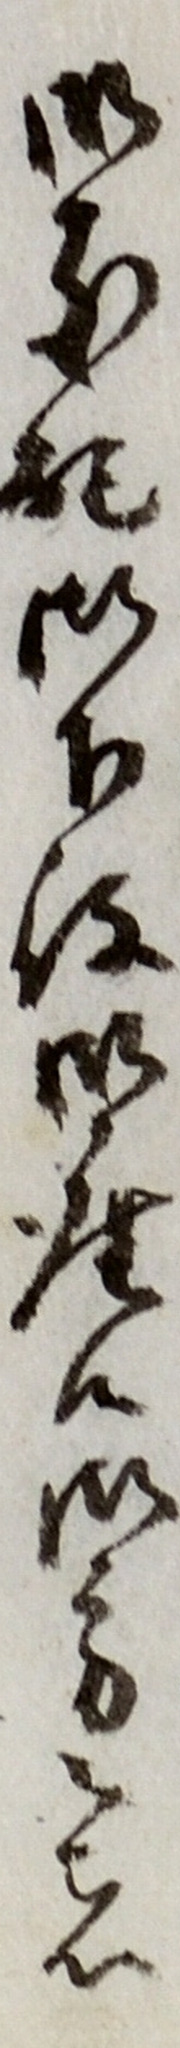御支配御下役御座候御方々は
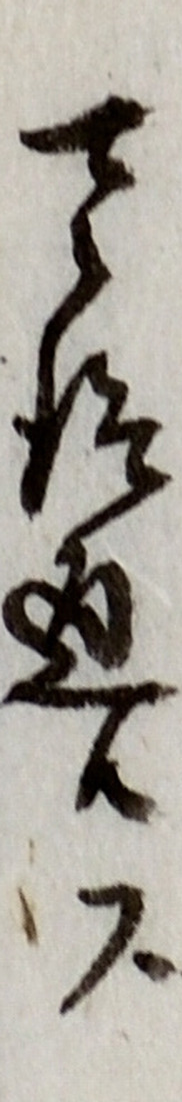可被仰達候以上
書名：諸事御用留帳
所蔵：伊那市立高遠町図書館・合同会社AMANE
